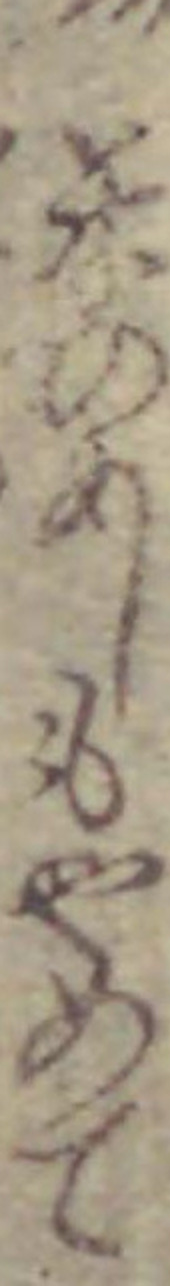米のめしもやめて
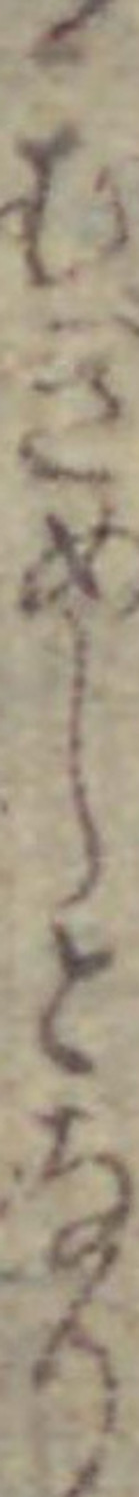むぎめしとなり
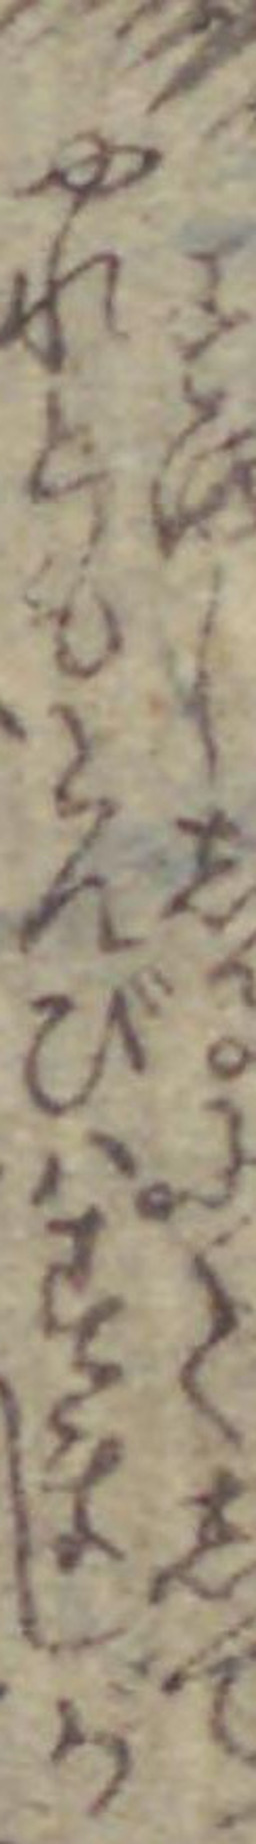やれともとんびはすましが
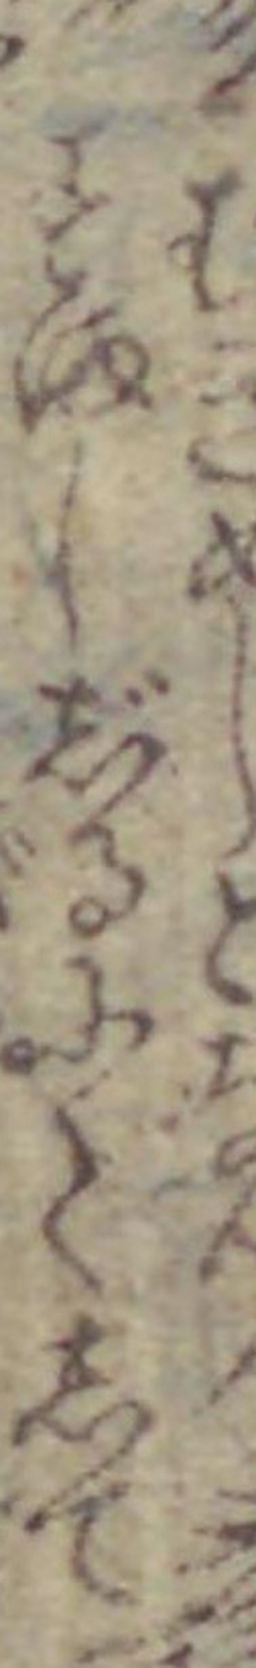すましじるにてして
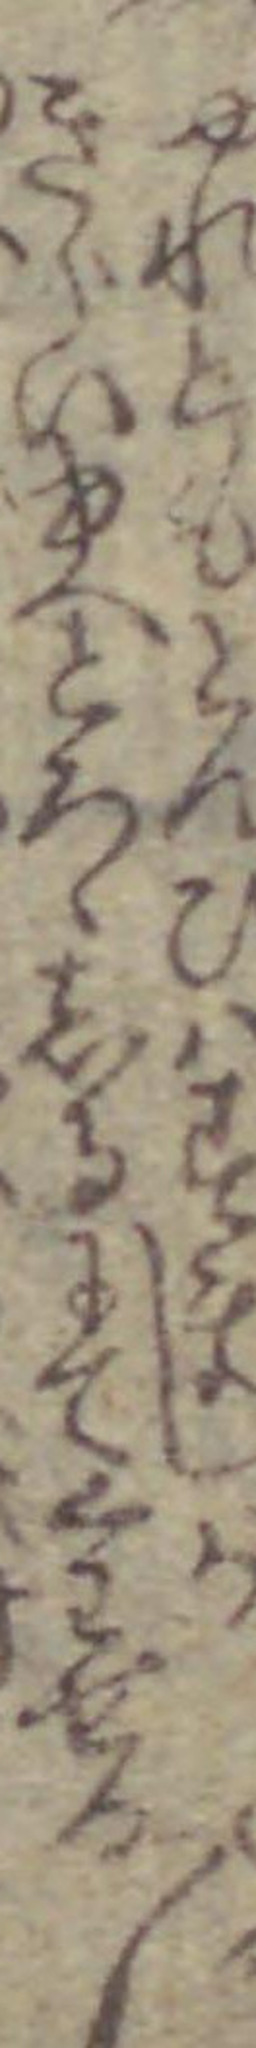きらいゆへとろゝしるにてくわせる
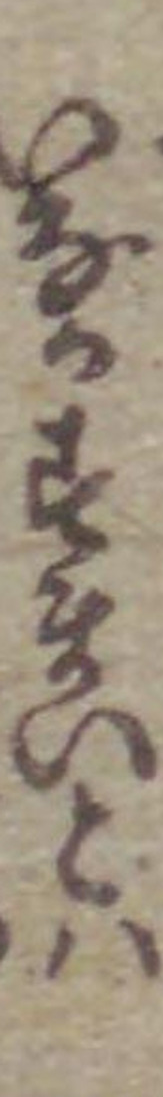いなかすまいとは
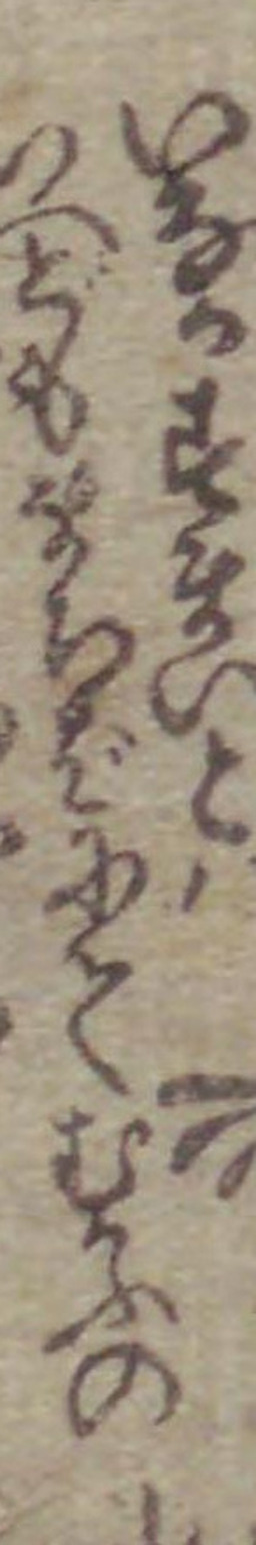いへどもまちばにてむかふの
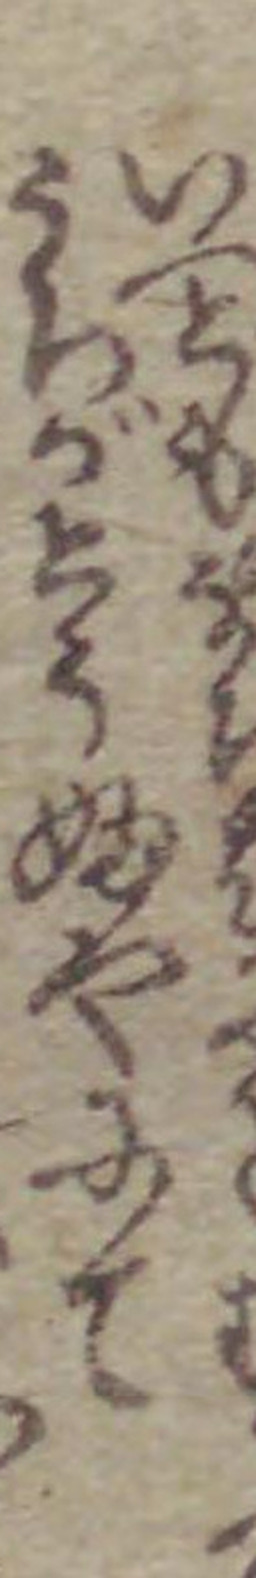うちがとうふやにて
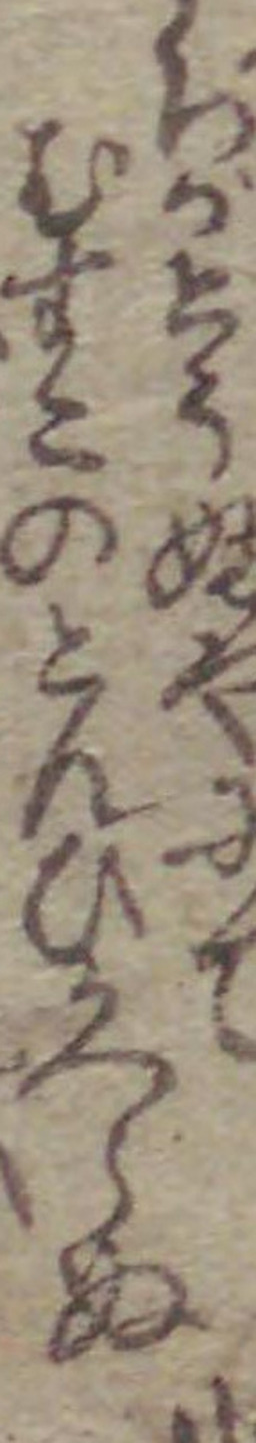むすこのとんひかへらぬ
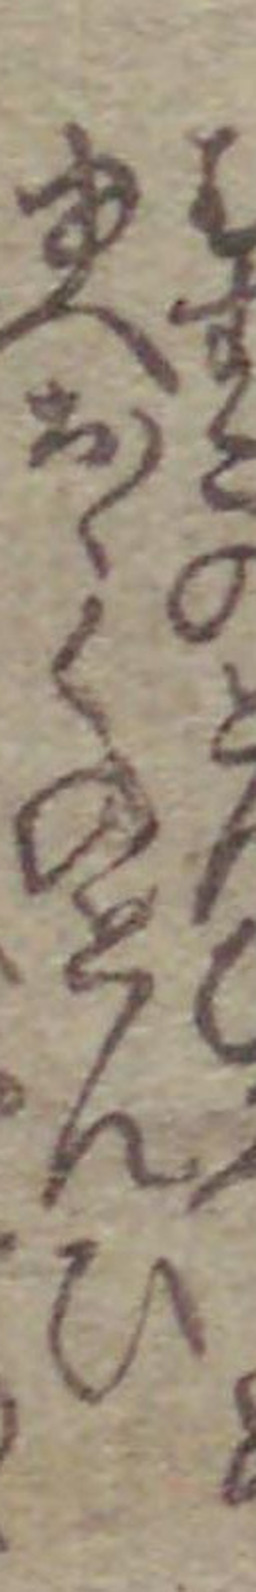ゆへおゝくのとんひ
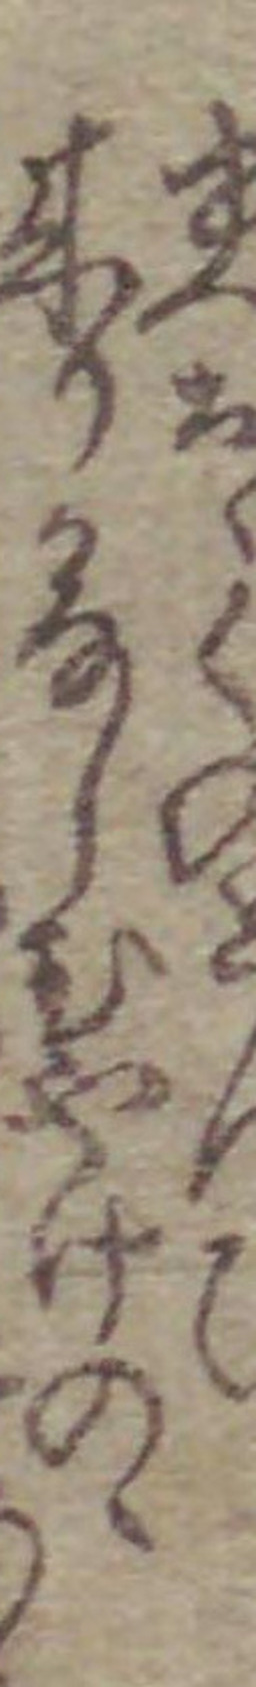来りかなしむやけのゝ
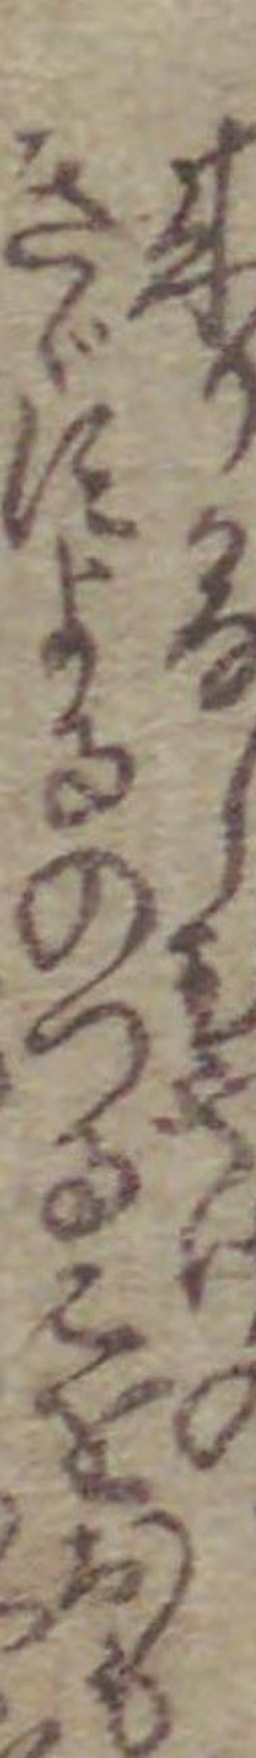きゞすよるのつるこをおも
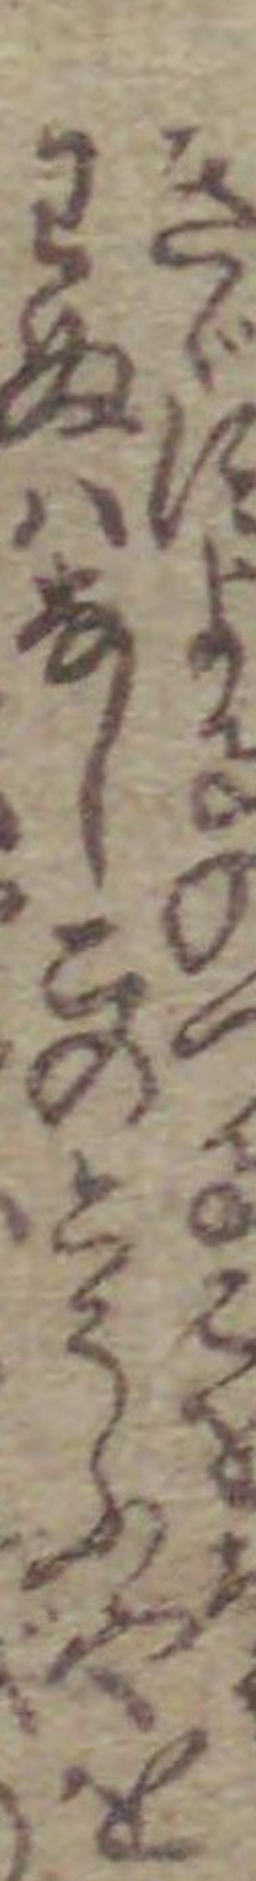わぬはなしこのとうふやを
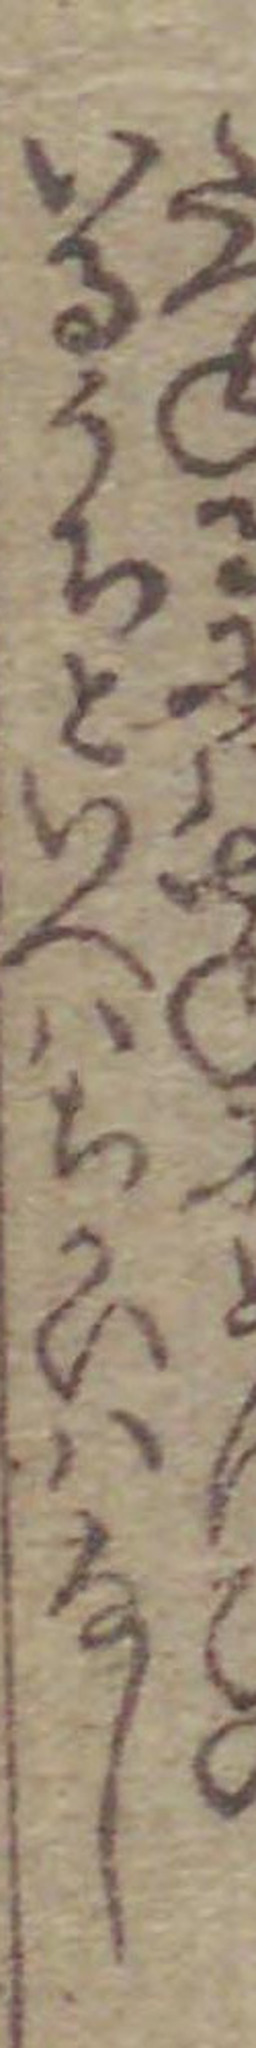いるうちといへはちかいはなし
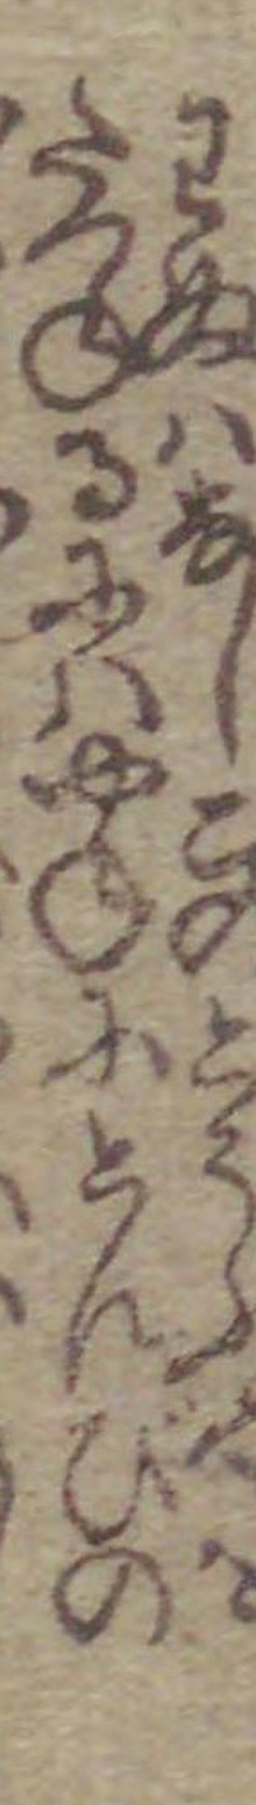たつねるにはやねにとんびの

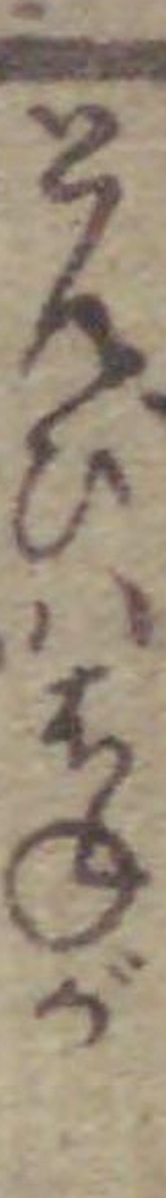とんびははねが
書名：親父布子鳶握 3巻
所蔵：国立国会図書館 National Diet Library, JAPAN
